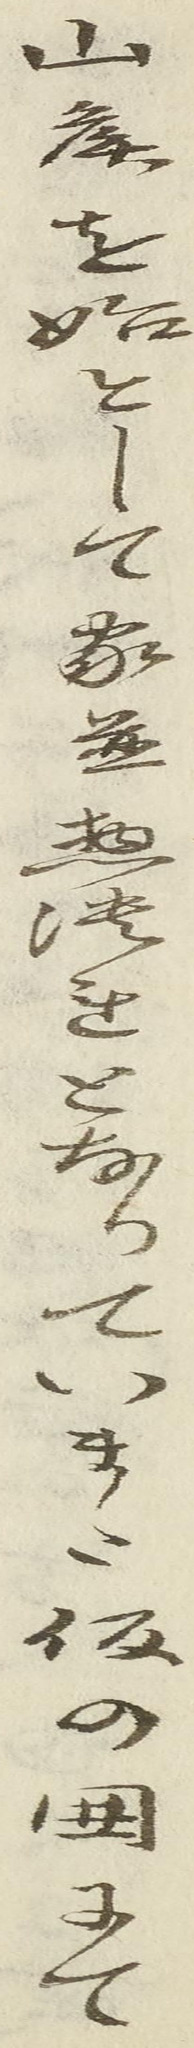山矦を始として家並惣潰れとなりていまた仮の囲にて
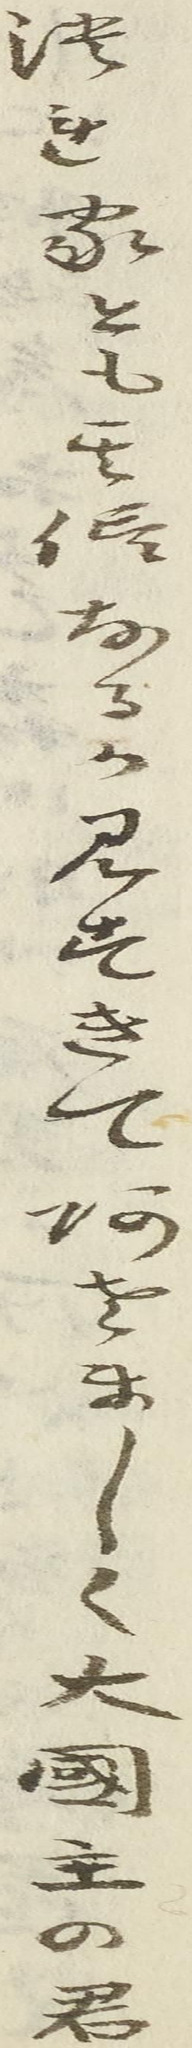潰れ家とも其儘なるか見すきてあけましく大国主の君
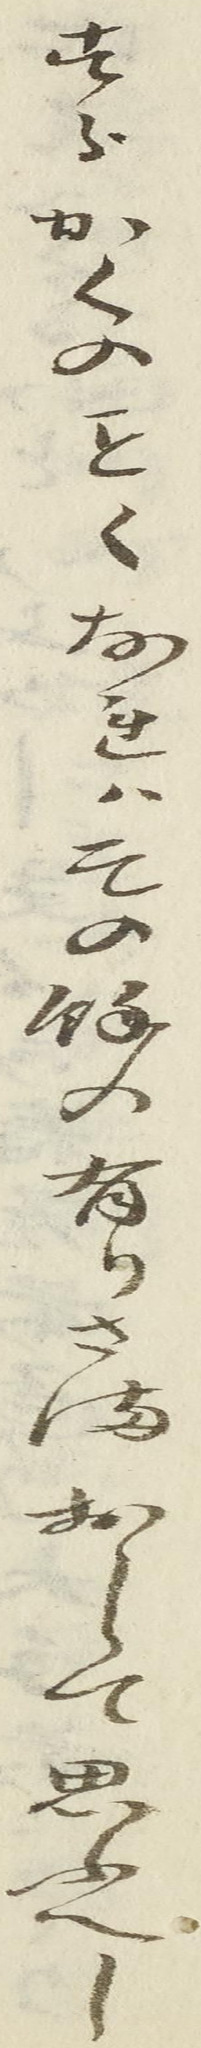すらかくのことくなれハその餘の有さまおして思ふへし
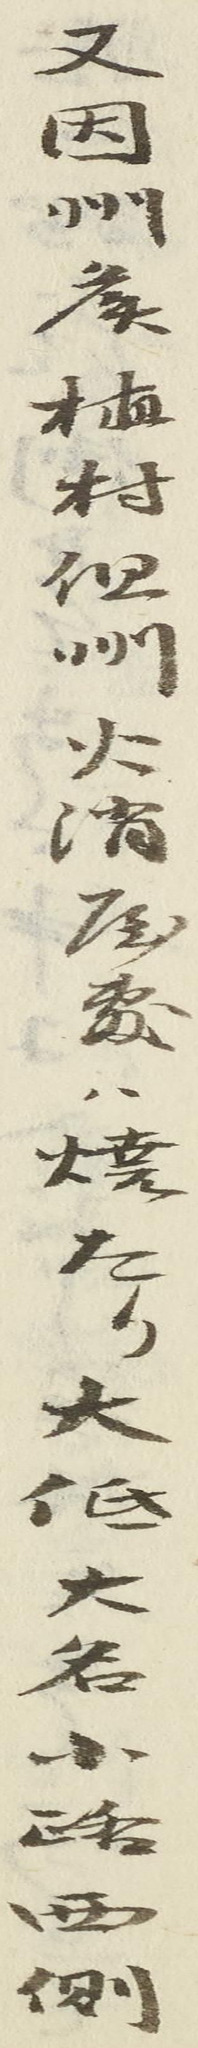又因州矦植村但州火消屋敷ハ焼たり大低大名小路西側
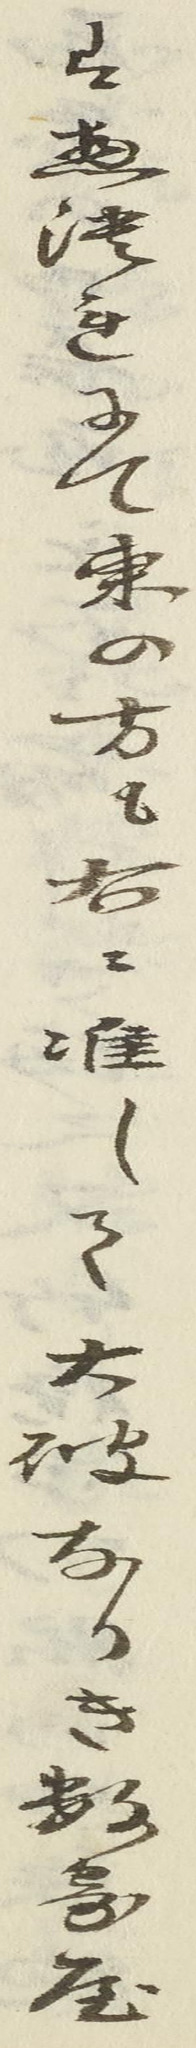は惣潰れにて東の方も右二準して大破なりき数寄屋
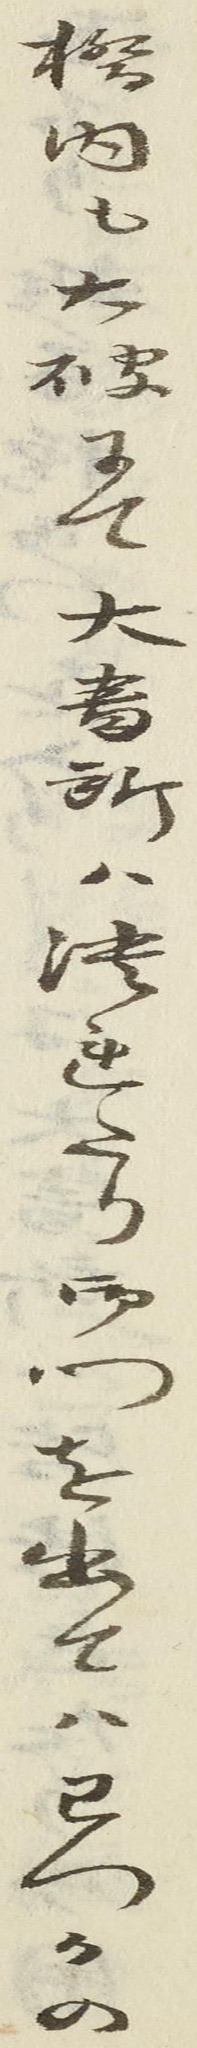橋内も大破にて大番所ハ潰れたり御門を出てハわつかの
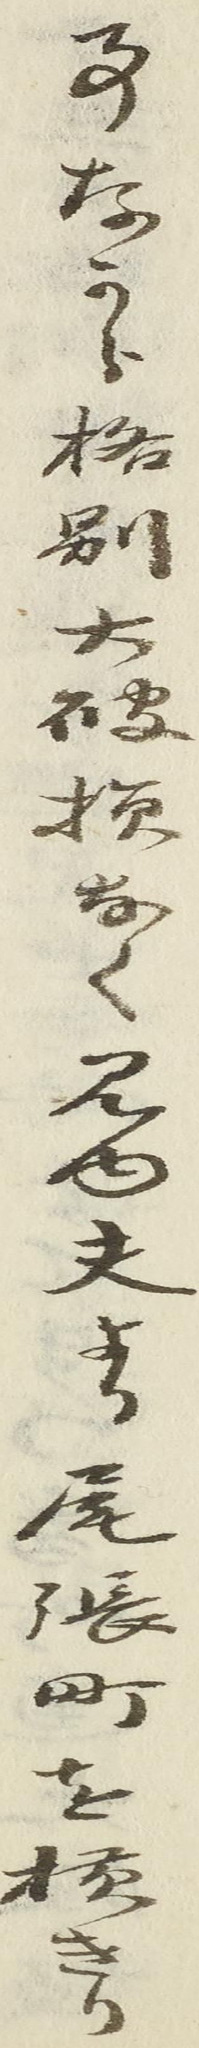事なから格別大破損なく見ゆ夫より尾張町を横きり
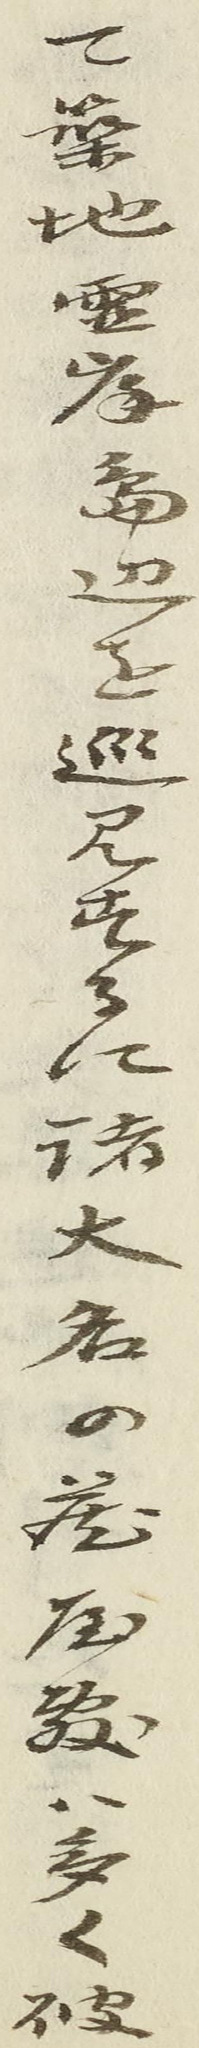て築地霊岸嶋辺を巡見するに諸大名の蔵屋敷ハ多く破
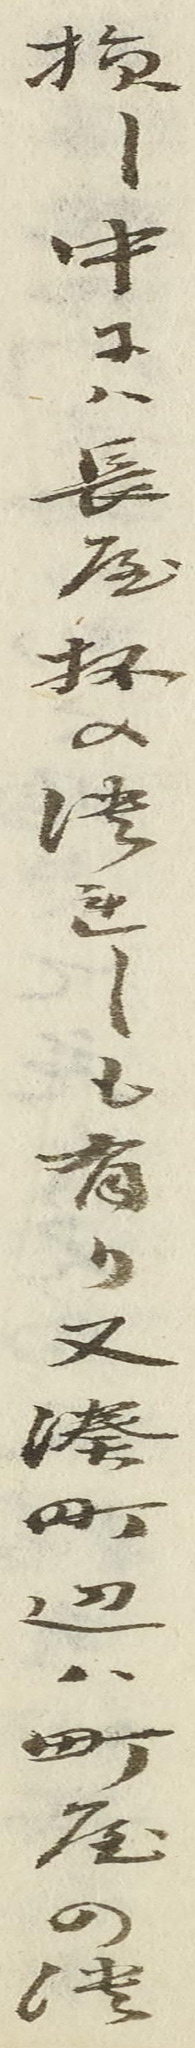損し中にハ長屋抔の潰れしも有り又湊町辺ハ町屋の潰
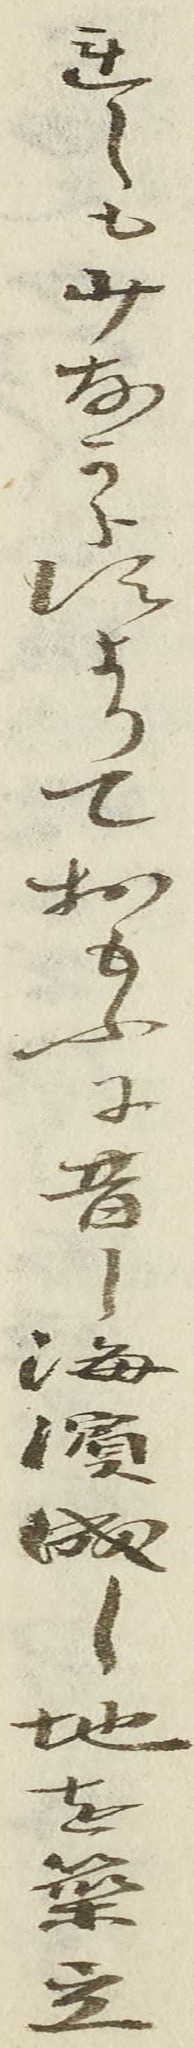れしも少なからすよりておもふに昔し海浜成し地を築立
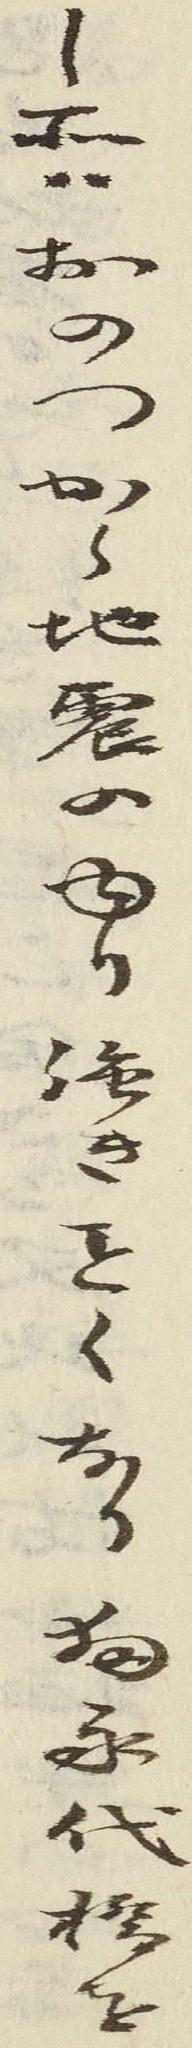し所ハおのつから地震のゆり強きことくなり猶永代橋を
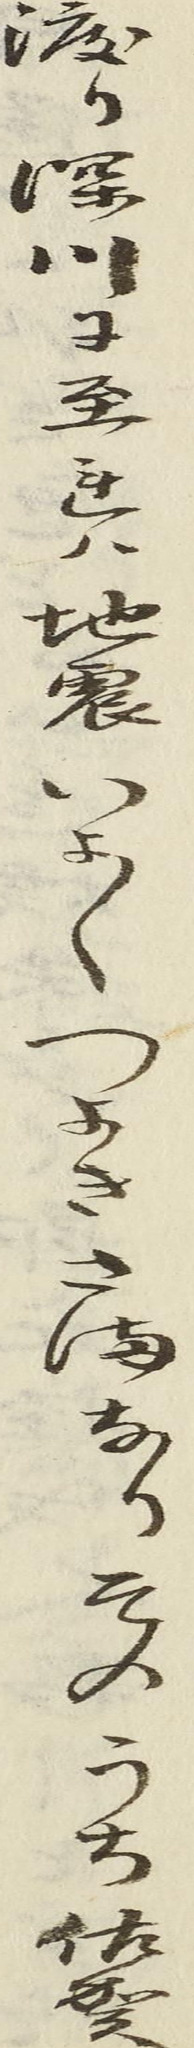渡り深川に至れハ地震いよつよきさまなりそのうち佐賀
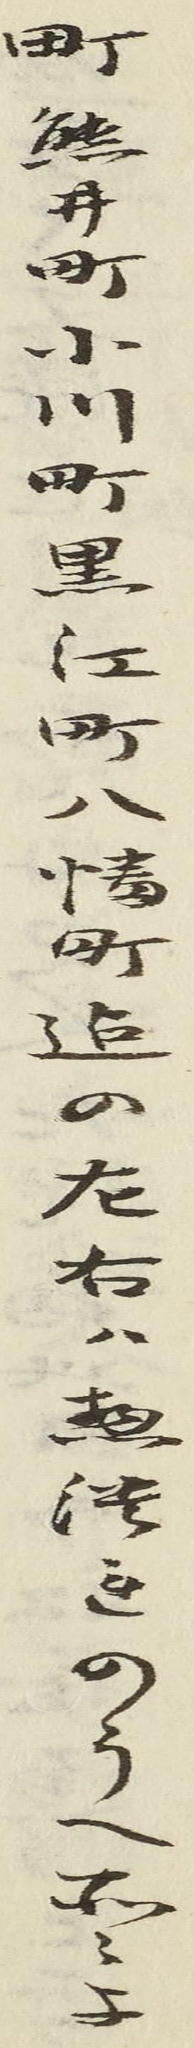町熊井町小川町黒江町八幡町迄の左右ハ惣潰れのうへ所々よ
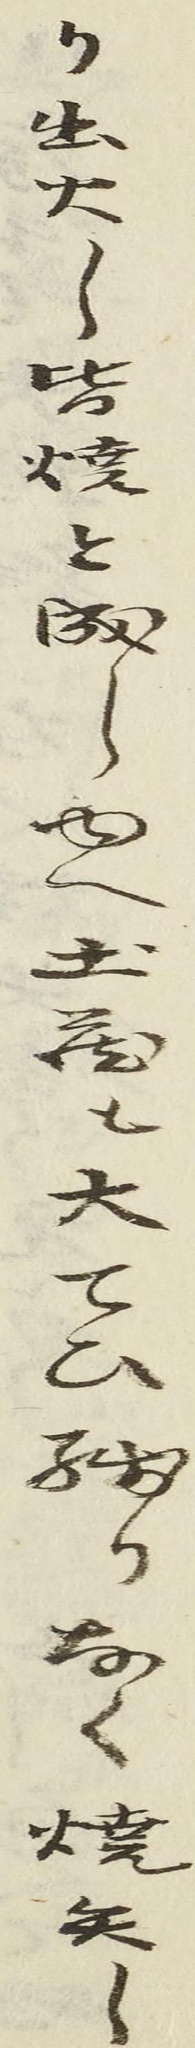り出火し皆焼と成しゆへ土蔵も大てひ残なく焼失し
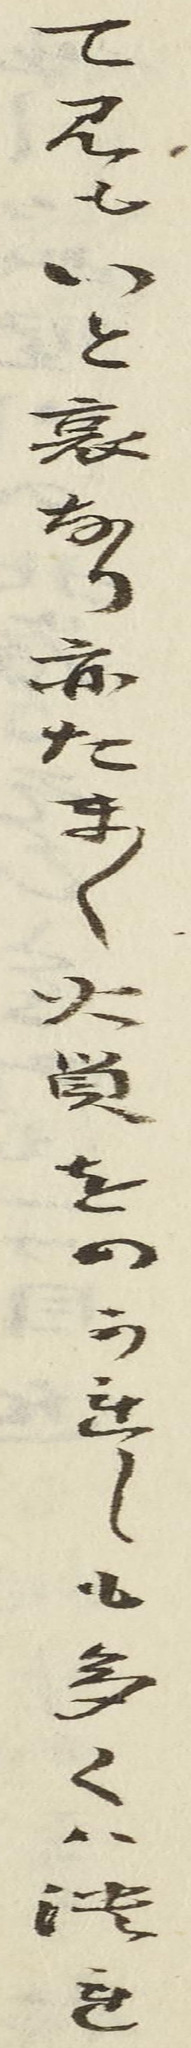て見もいと哀なり亦たま〳〵火災をのかれしも多くハ潰れ
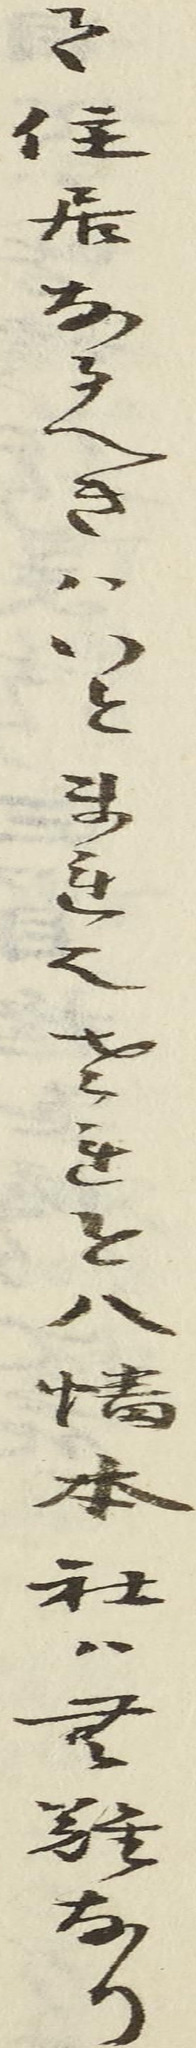て住居なるへきハいとまれ也けれと八幡本社ハ無難なり
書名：那為の後見艸　全
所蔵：東京大学地震研究所図書室 Earthquake Research Institute Library, The University of Tokyo, JAPAN
